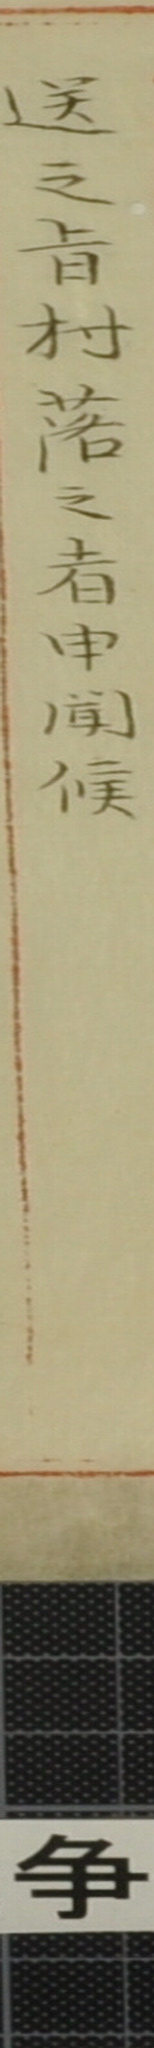送之旨村落之者申聞候
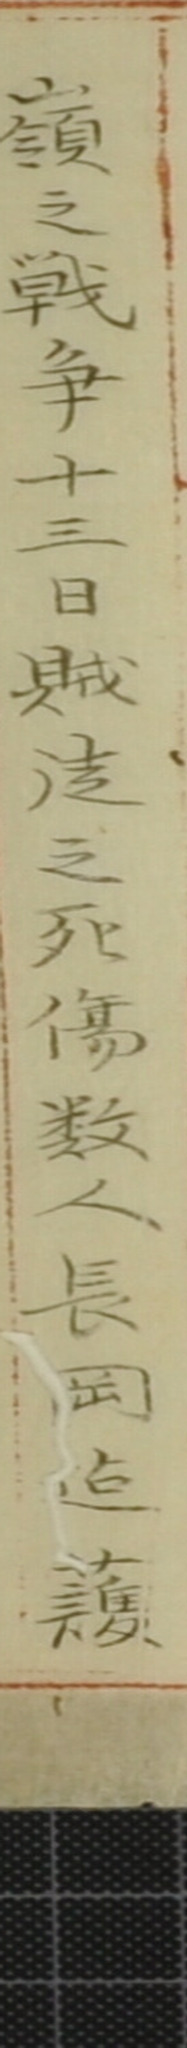嶺之戦争十三日賊徒之死傷数人長岡迄護
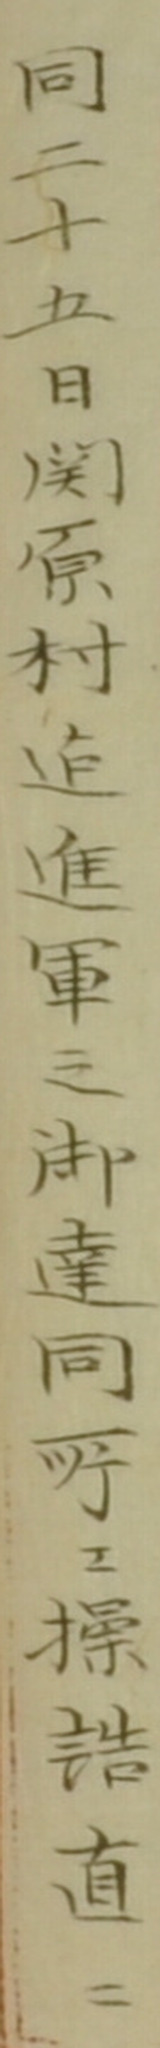同二十五日関原村迄進軍之御達同所エ操詰直ニ
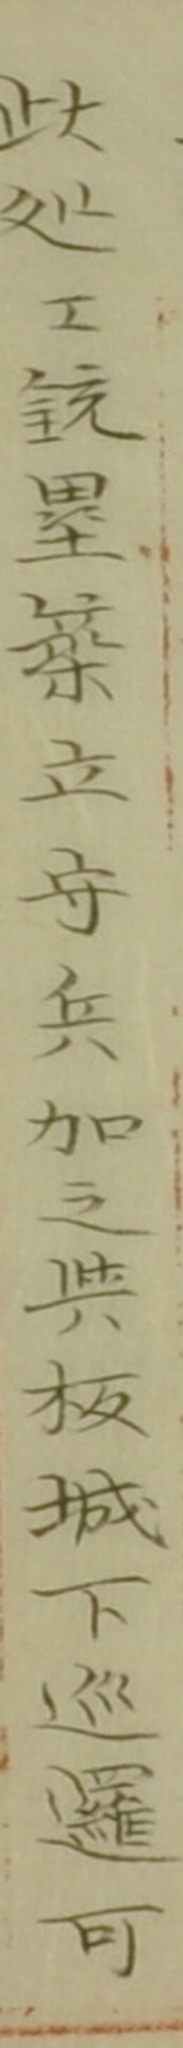此処エ銃塁築立守兵加之與板城下巡邏可
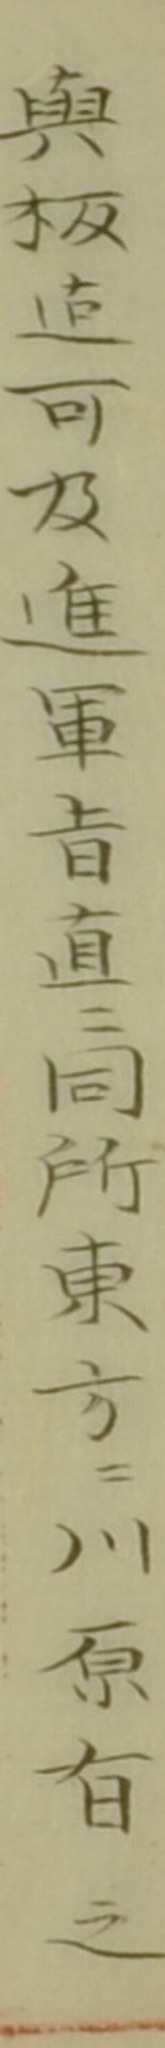與板迄可及進軍旨直ニ同所東方ニ川原有之
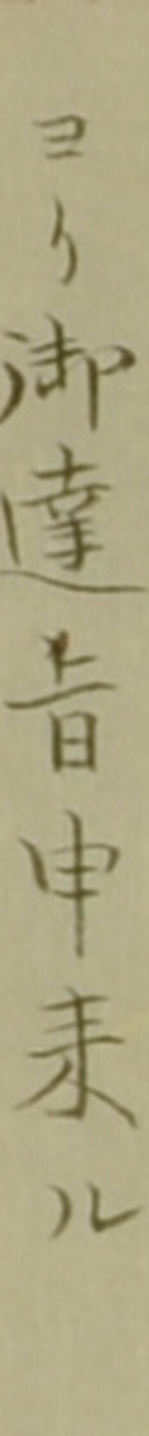ヨリ御達旨申来ル
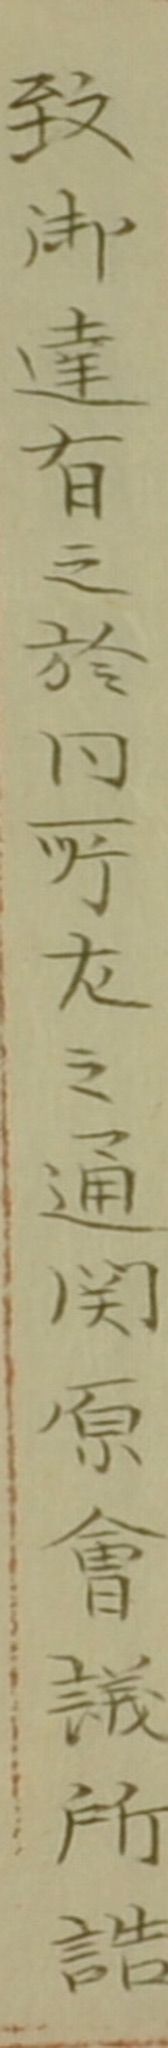致御達有之於同所左之通関原会議所詰
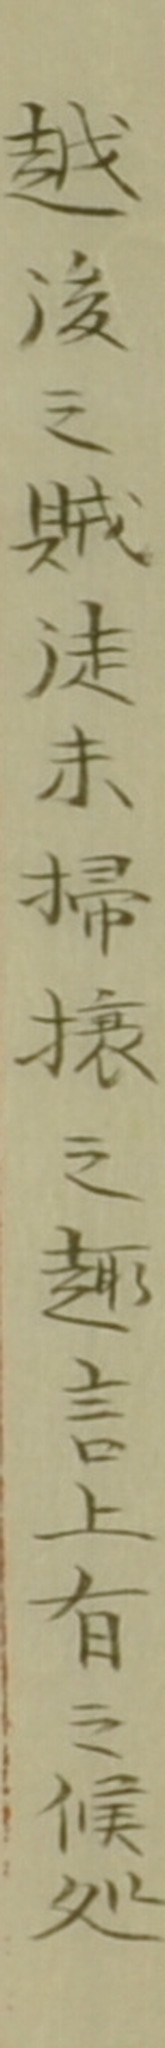越後之賊徒未掃攘之趣言上有之候処
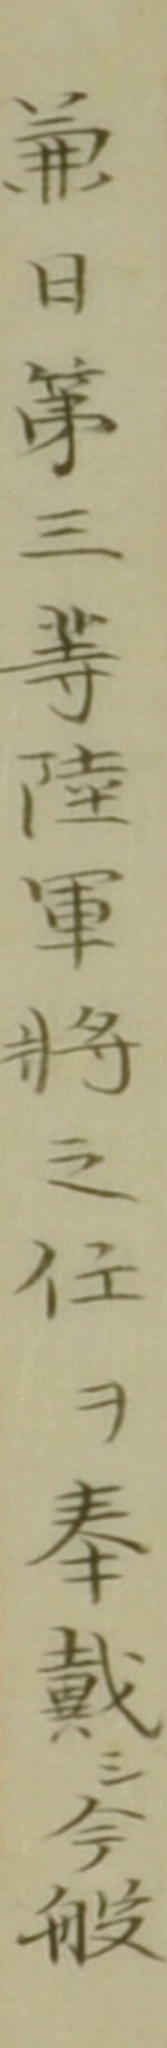兼日第三等陸軍将之任ヲ奉戴シ今般
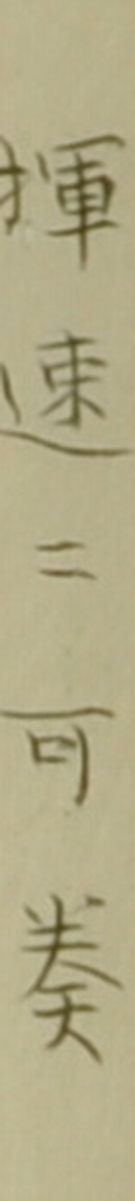揮速ニ可奏
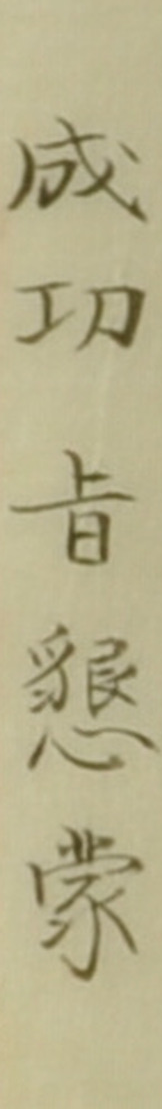成功旨懇蒙

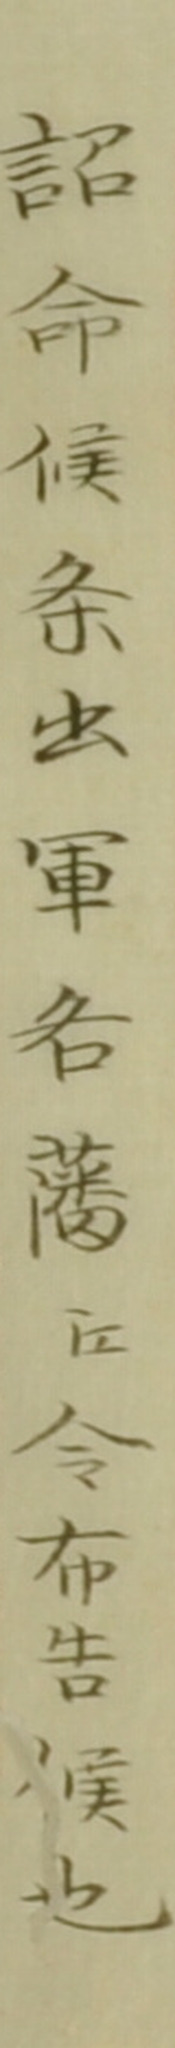詔命候条出軍各藩江令布告候也
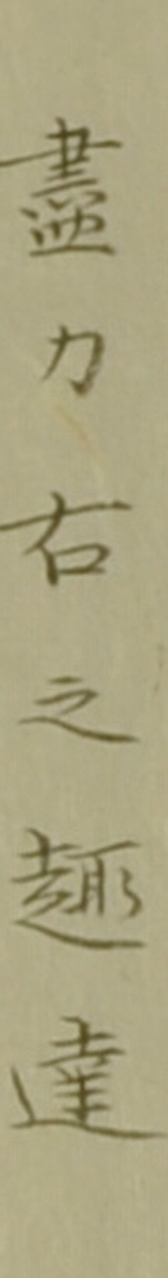尽力右之趣達
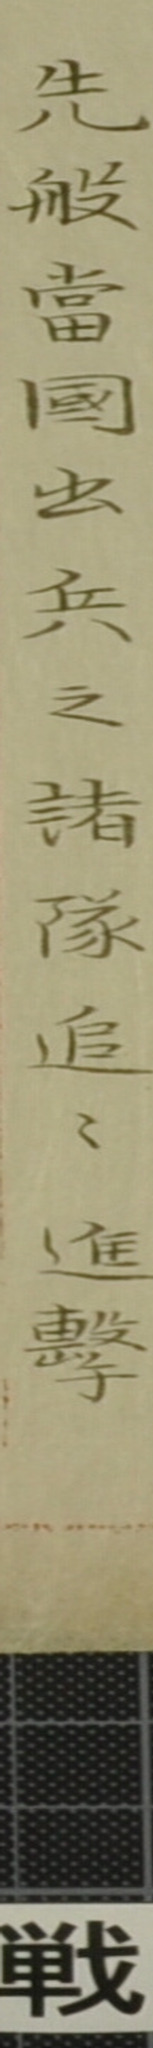先般当国出兵之諸隊追々進撃
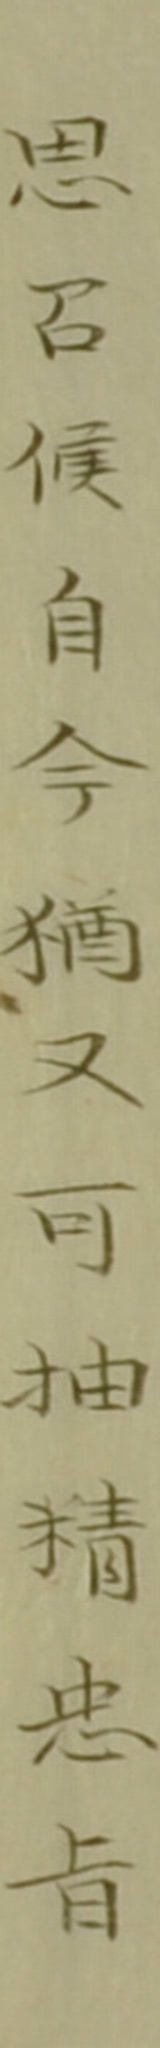思召候自今猶又可抽精忠旨
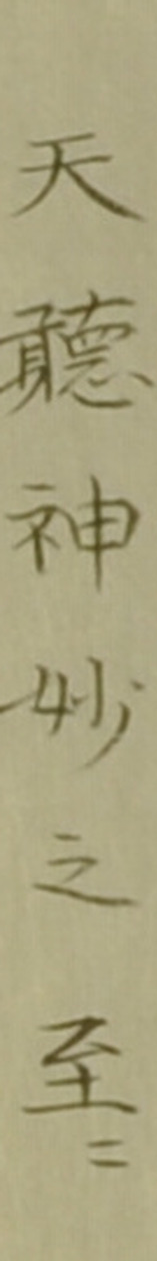天聴神妙之至ニ
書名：奥越出兵中戦争之事件概略抄録（控）
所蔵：伊那市立高遠町図書館・合同会社AMANE
